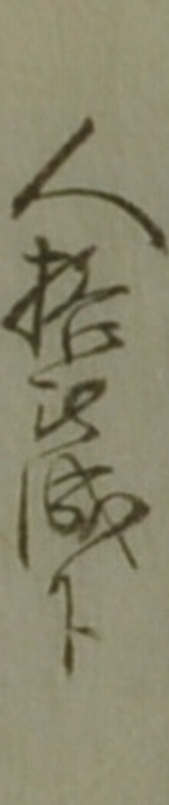人格被成下
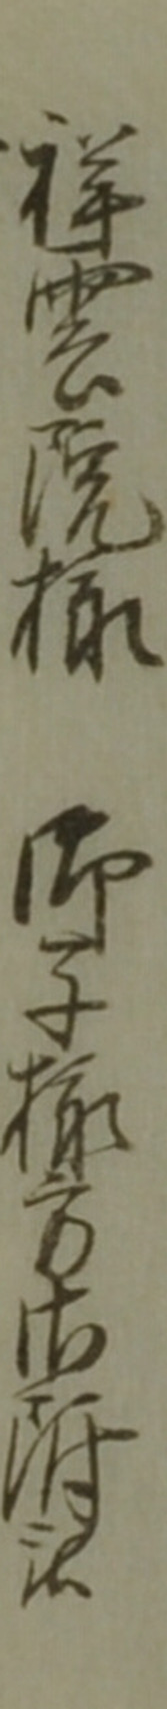祥雲院様御子様方御附被
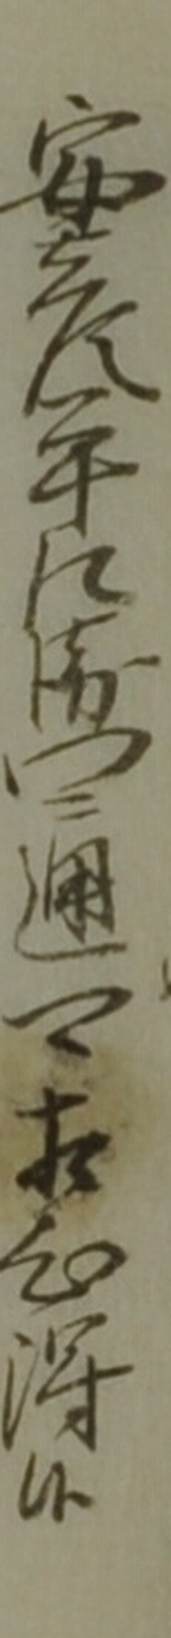安彦平左衛門通可相心得候
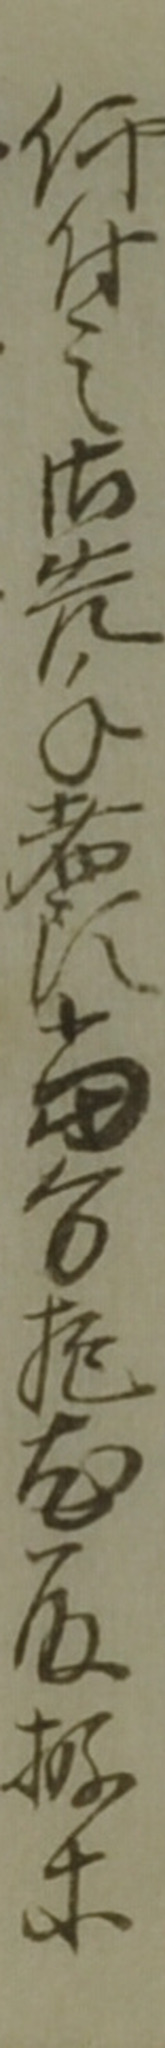仰付之御先手者頭当方抱尤取扱等
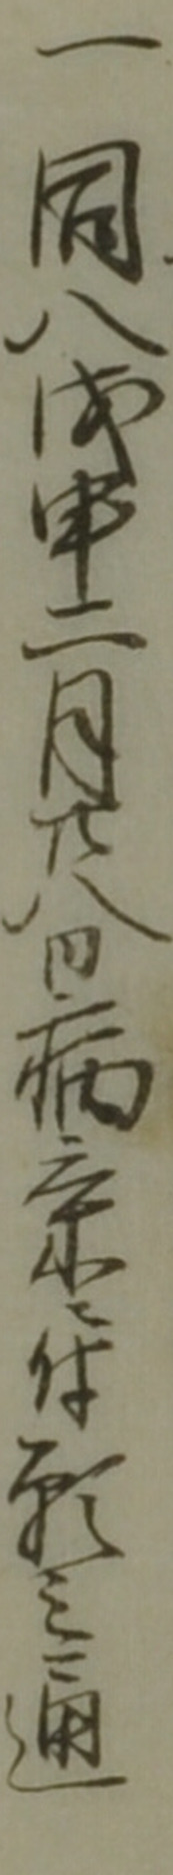一同八戊申二月廿八日病気ニ付願之通
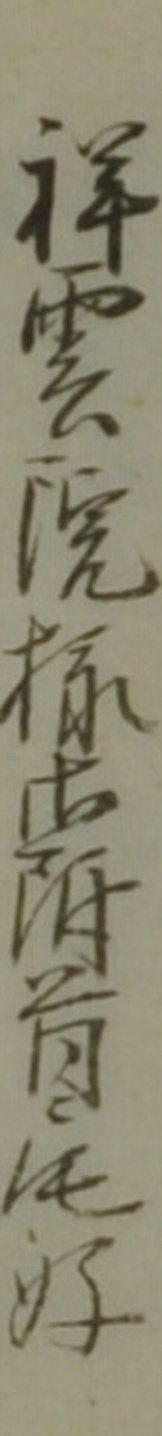祥雲院様御附首尾好
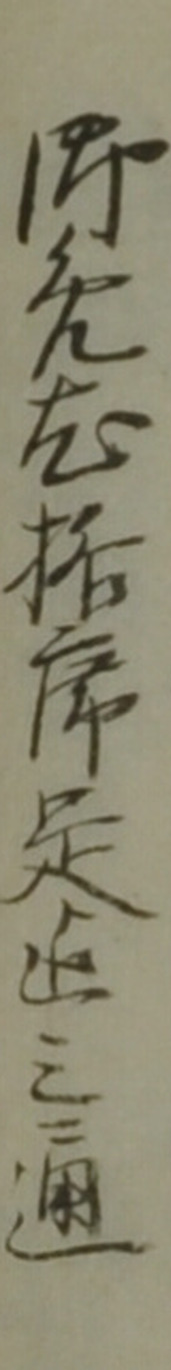御免尤格席是迄之通
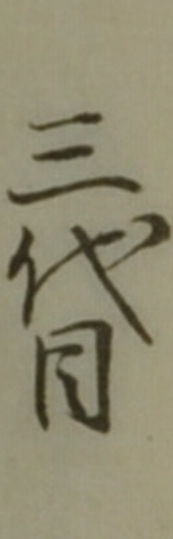三代目
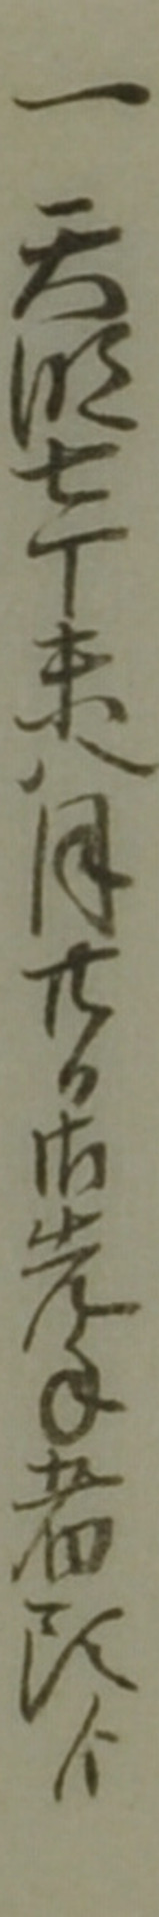一天明七丁未八月廿日御先手者頭ゟ
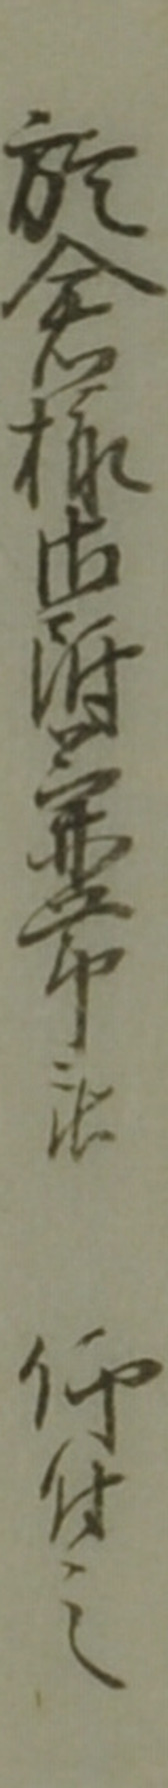於倉様御附兼帯被仰付之
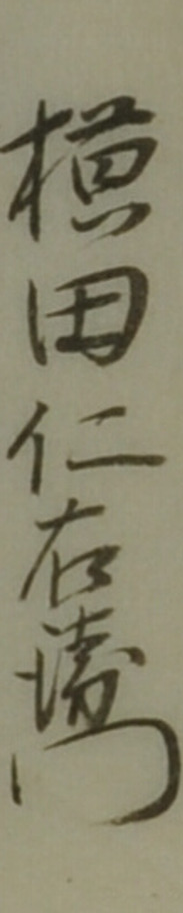横田仁右衛門
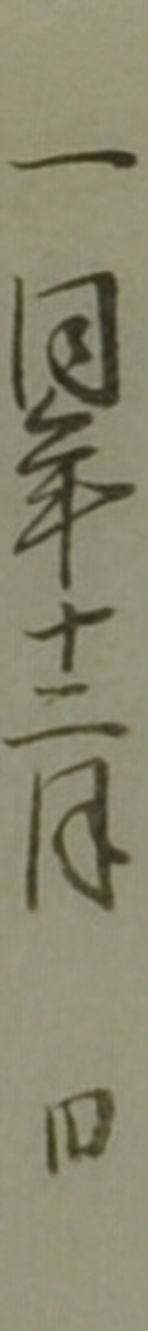一同年十二月日
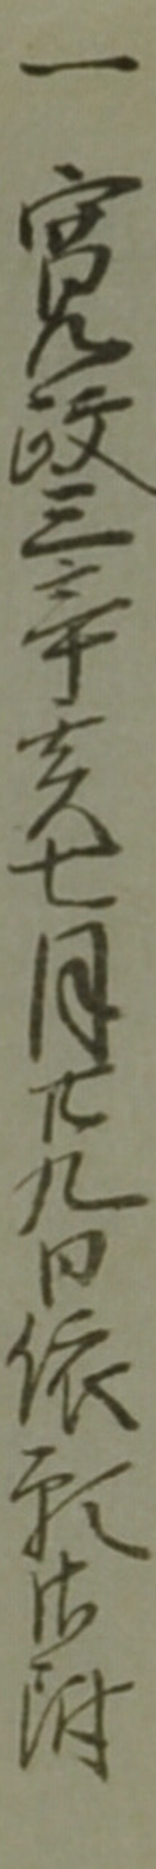一寛政三辛亥七月廿九日依願御附
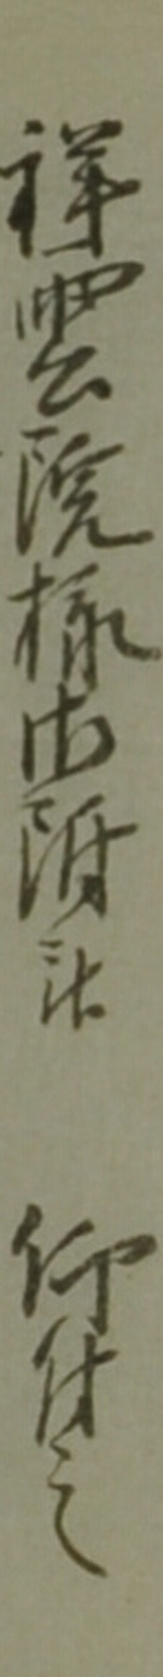祥雲院様御附被仰付之
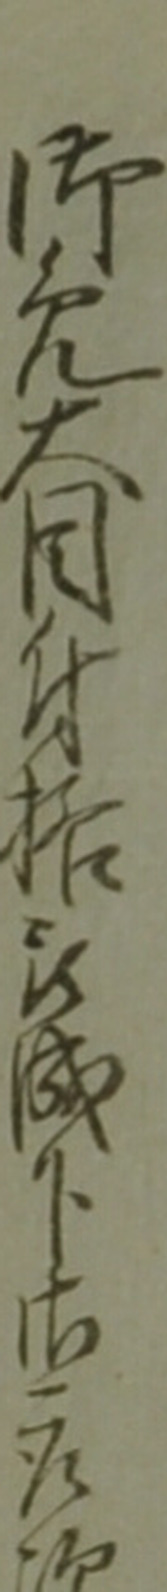御免大目付格被成下御取次被
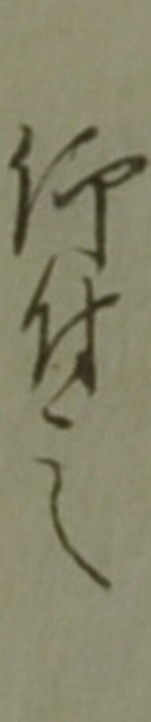仰付之
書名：諸御役代々録（六）
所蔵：伊那市立高遠町図書館・合同会社AMANE
